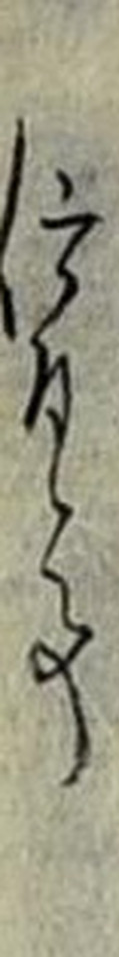仰付候事
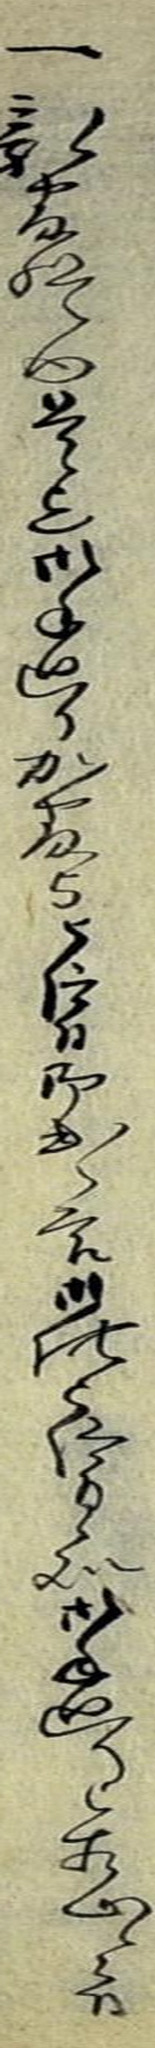一新番組之内是迄御手廻り加番与被仰付御出之節御供被仰付候処御手廻り被相止候に付
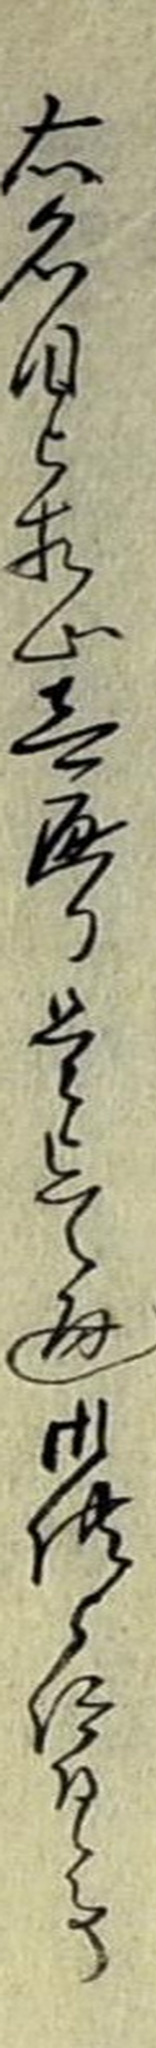右名目被相止壱通り是迄之通御供被仰付候事
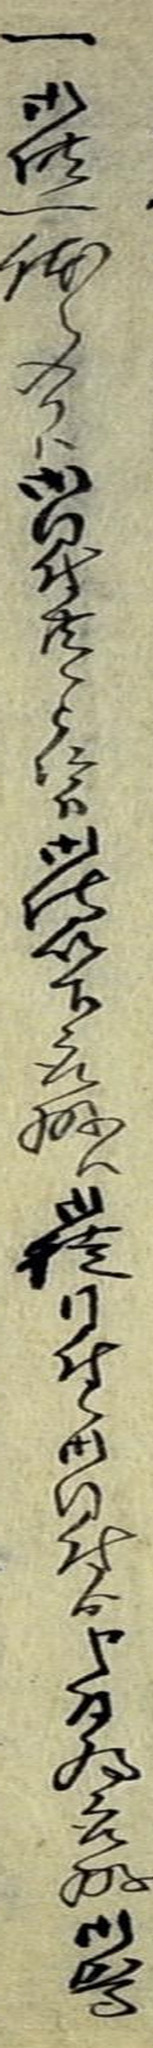一御供一体之〆りは御目付共へ被仰付御侍以下取扱は御徒目付へ御目付ゟ申付為取扱御駕
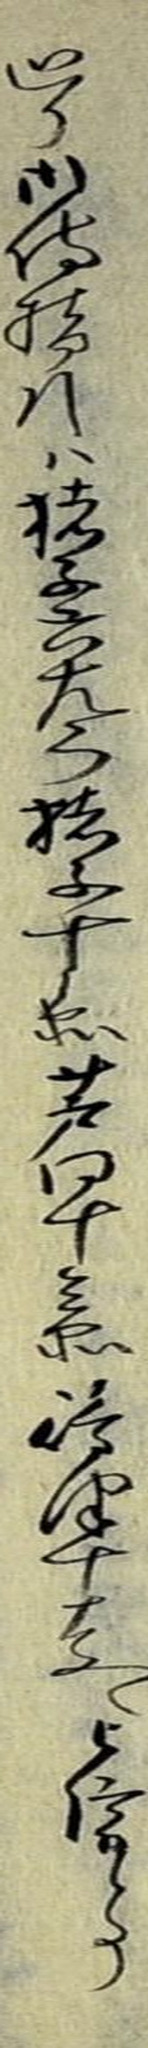廻り御侍指引は猪子六左衛門猪子十兵衛芦田十兵衛島津十大夫へ被仰付候事
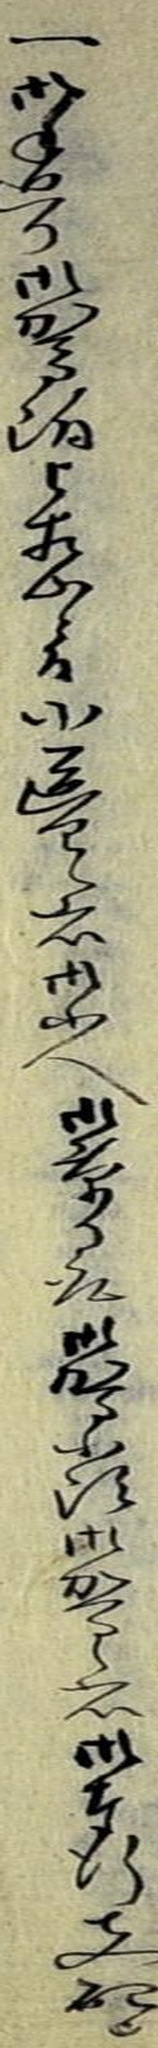一御手廻り御駕附被相止に付小道具之者御小人御草り取御駕小頭御駕之者御奉行支配被
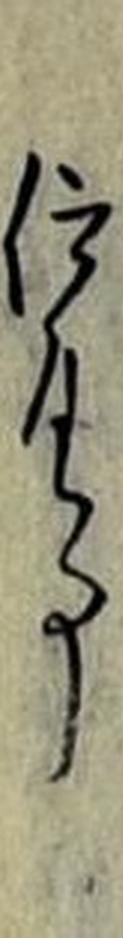仰付候事
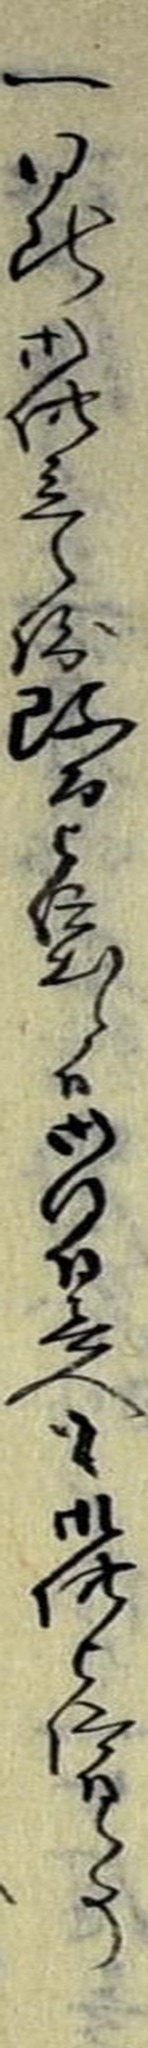一同断御供立之儀改而被仰出候に付御目付壱人ツヽ御供被仰付候事
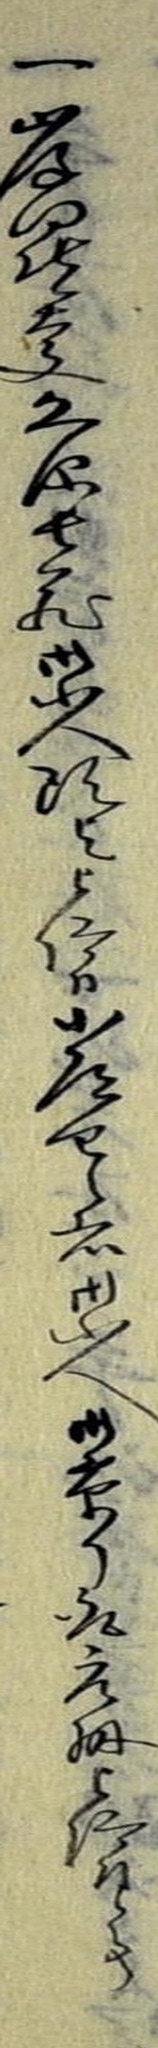一岸田次郎大夫久保長蔵御小人頭と被仰付小道具之者御小人御草り取取扱被仰付候事
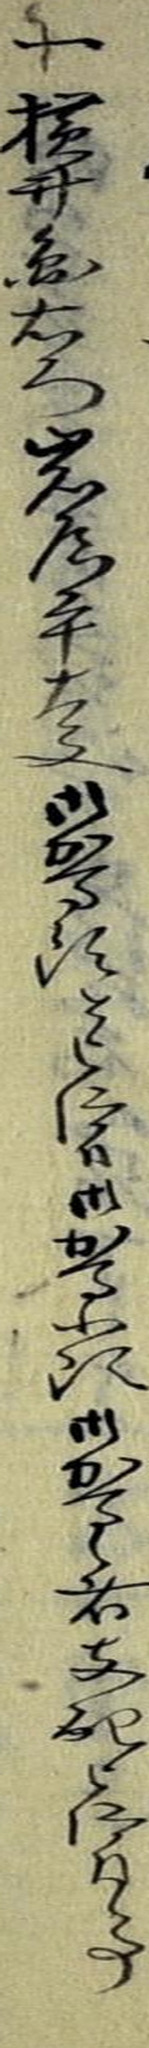一横井円右衛門岩屋平太夫御駕頭を被仰付御駕小頭御駕之者支配被仰付候事
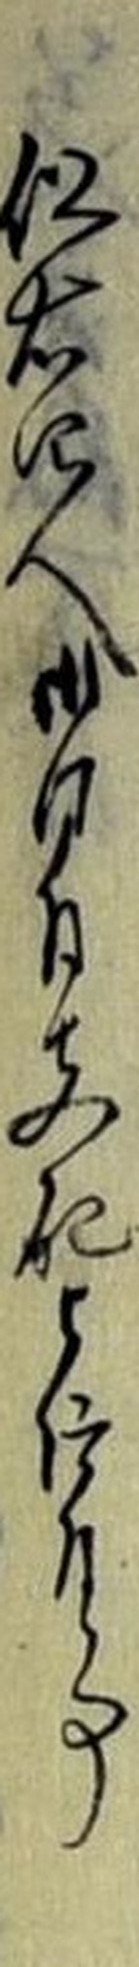但右四人御目付支配被仰付候事
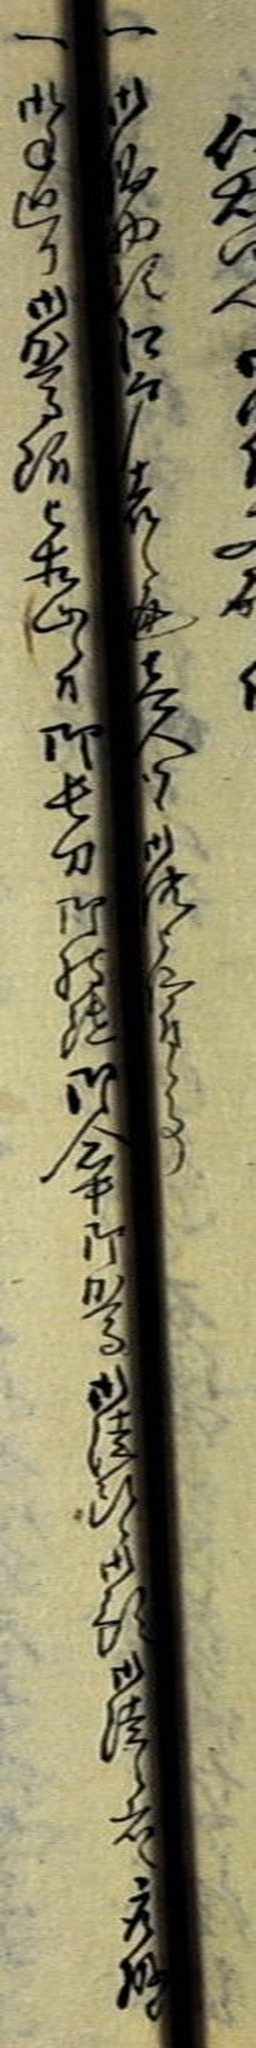一御手廻り御駕附被相止候に付御長刀御持鑓御傘御駕御徒頭御預御徒之者へ取扱被
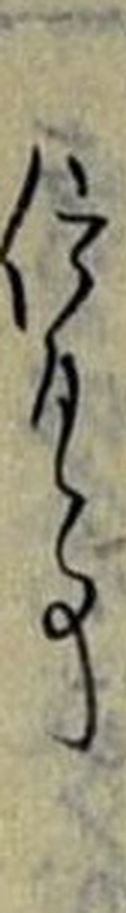仰付候事
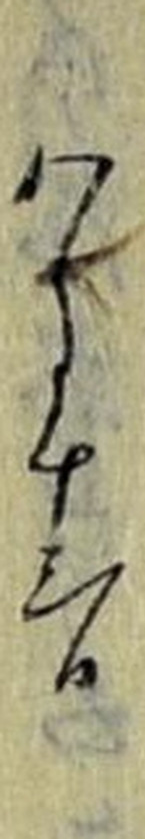八月十三日
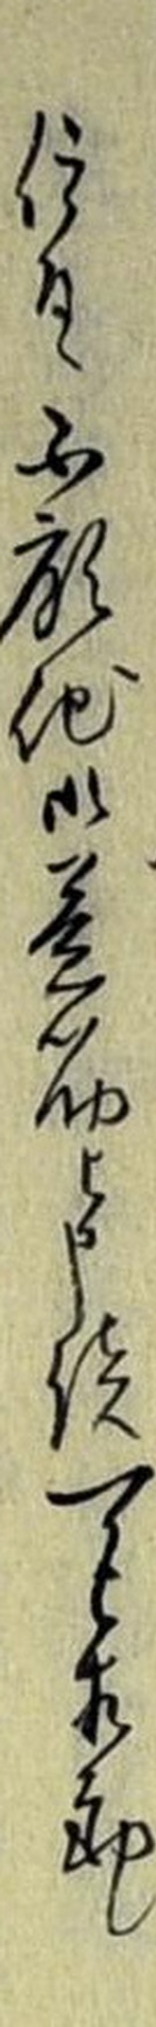仰付候不顧他御益筋被申談可被相勤候
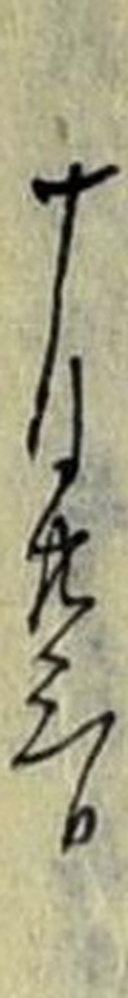十月廿三日
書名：命令之部 二
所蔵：福井県文書館 Fukui Prefectural Archives
